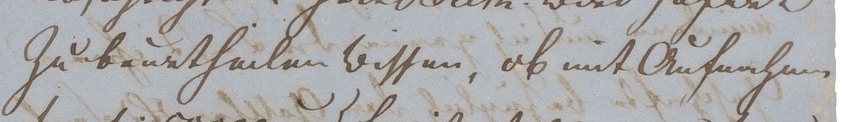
zu beurtheilen wissen, ob mit Aufnahmen
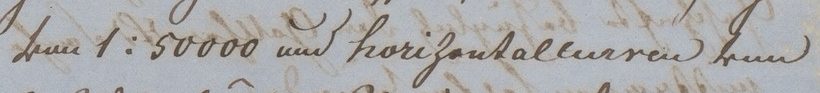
von 1:50000 und horizontalcurven von
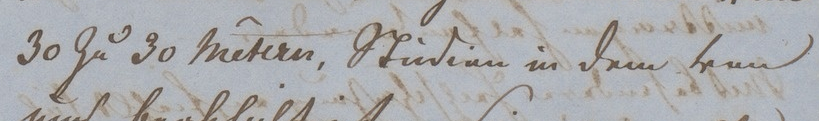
30 zu 30 Metern, Studien in dem von
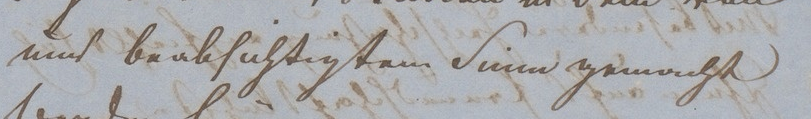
uns beabsichtigten Sinne gemacht
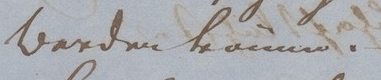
werden können. –
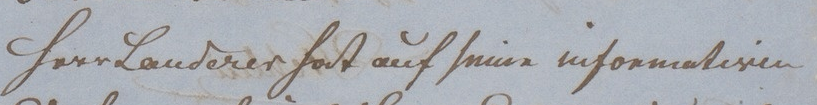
Herr Landerer hat auf seine informativen
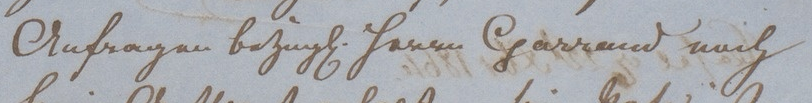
Anfragen bezügl. Herrn Garrand noch
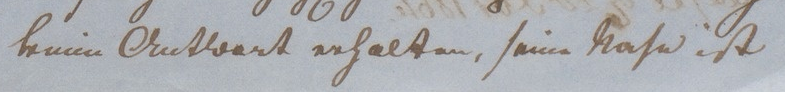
keine Antwort erhalten, seine Nase ist
